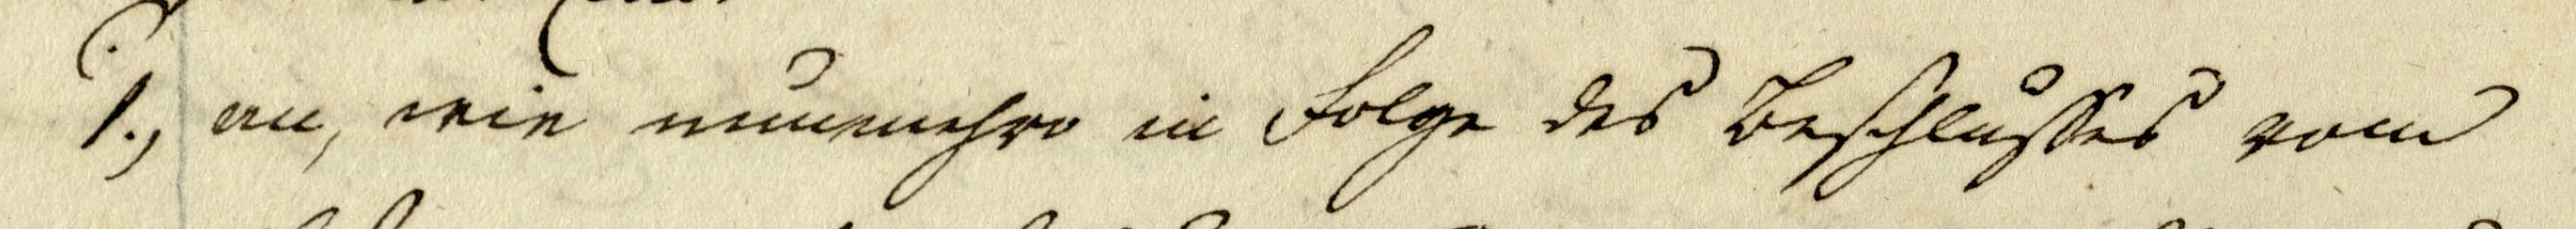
1., an, wie nunmehro in Folge des Beschlusses vom
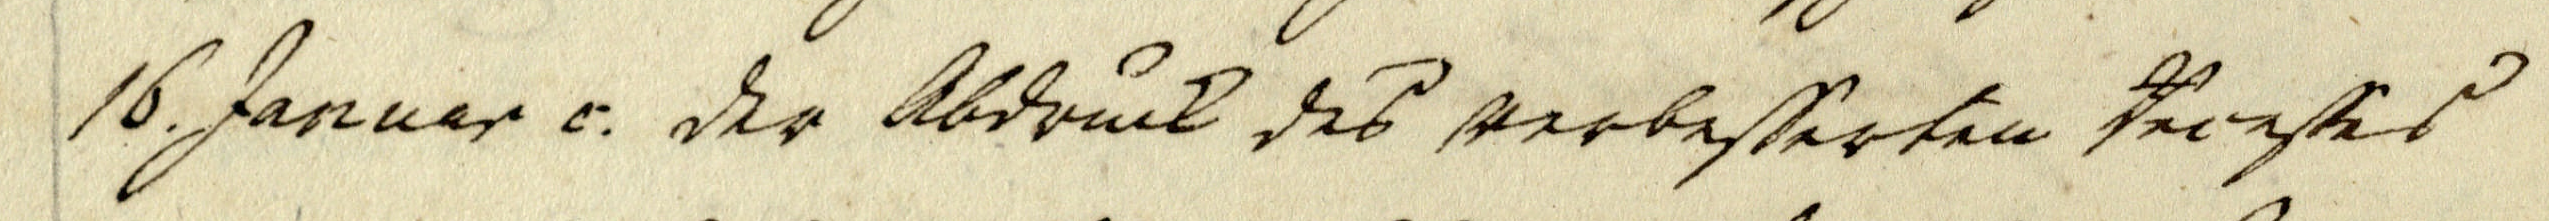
16. Januar c. der Abdruck des verbesserten Recesses
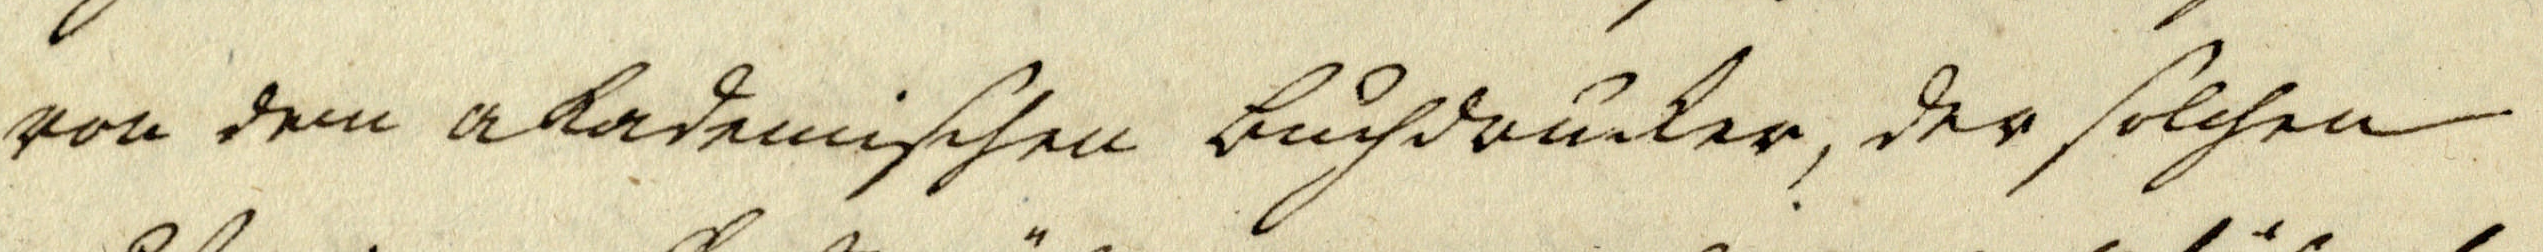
von dem akademischen Buchdrucker, der solchen
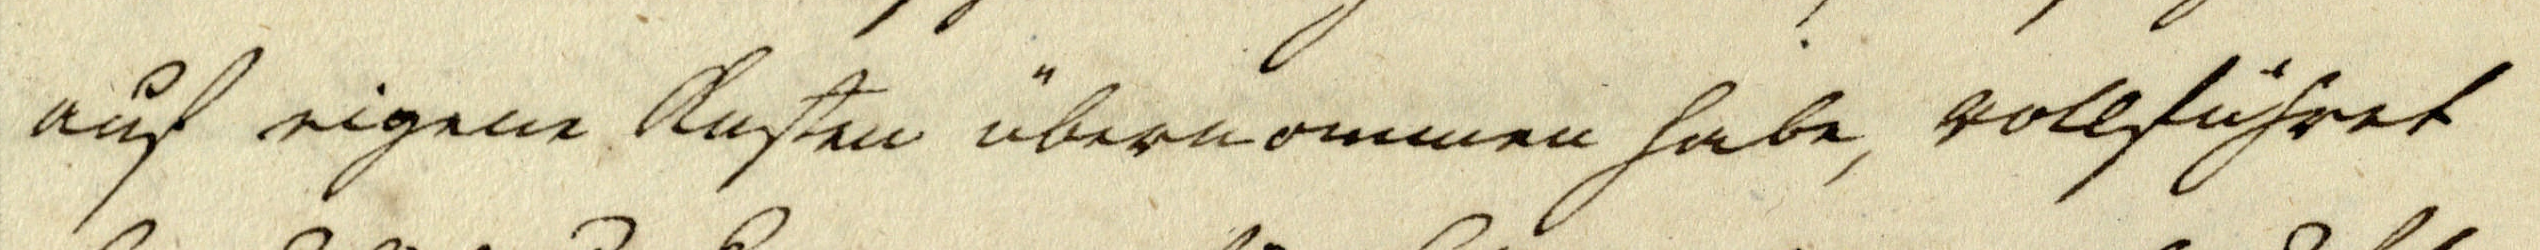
auf eigene Kosten übernommen habe, vollführet
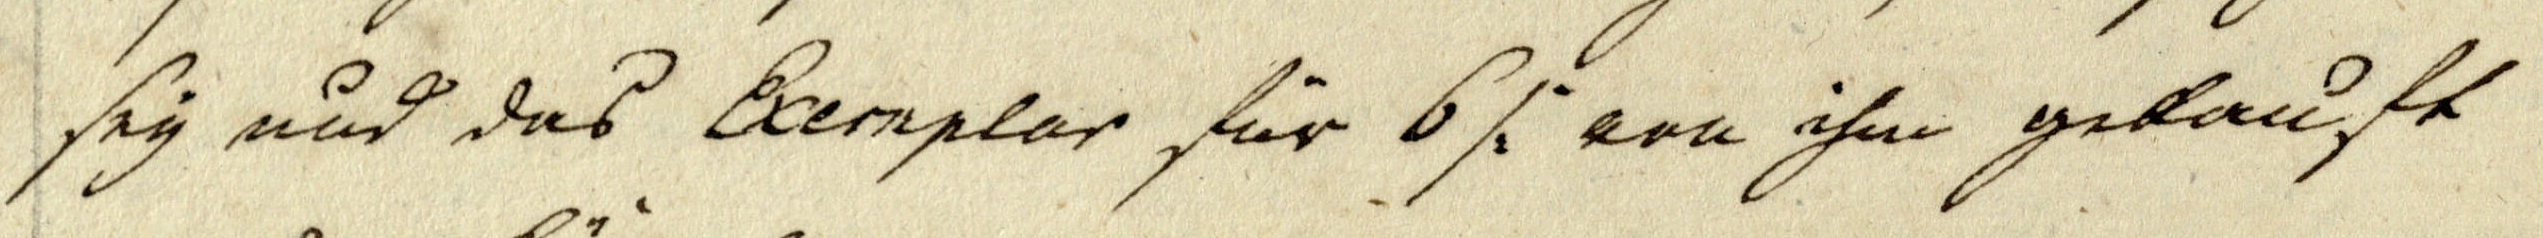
seÿ und das Exemplar für 6 s. von ihm gekauft
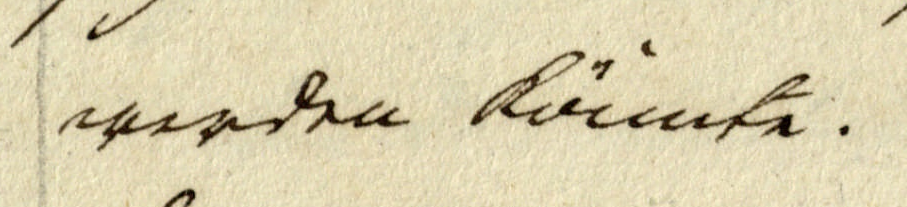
werden könnte.
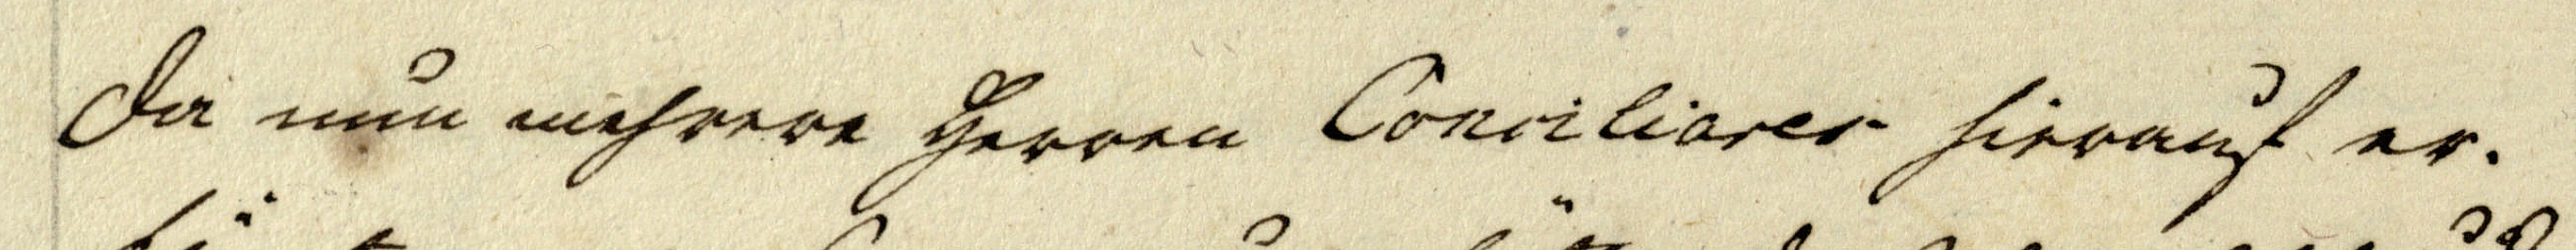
Da nun mehrere Herren Conciliares hierauf er¬
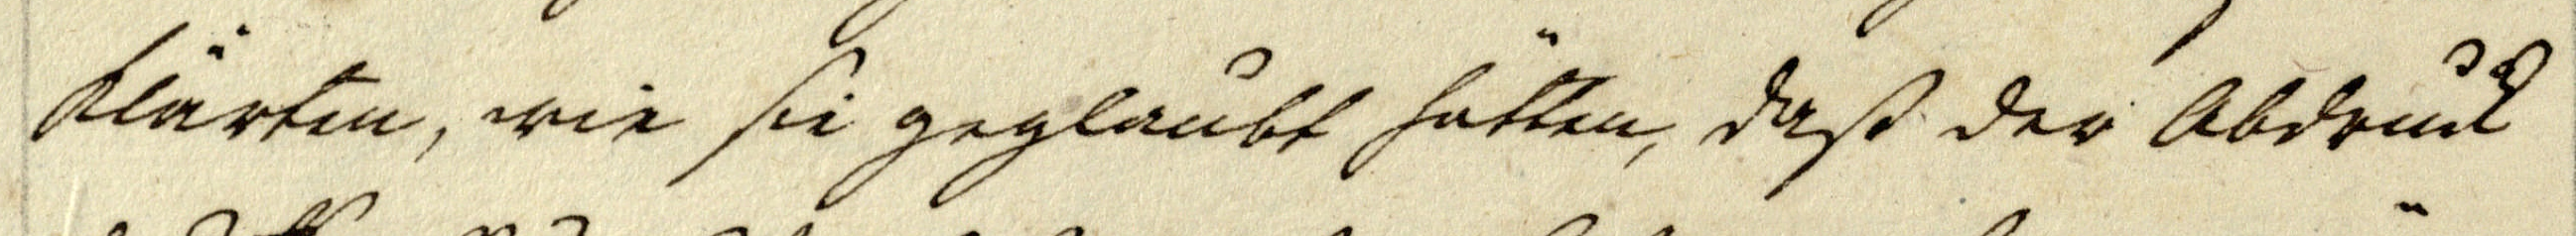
klärten, wie sie geglaubt hätten, daß der Abdruck
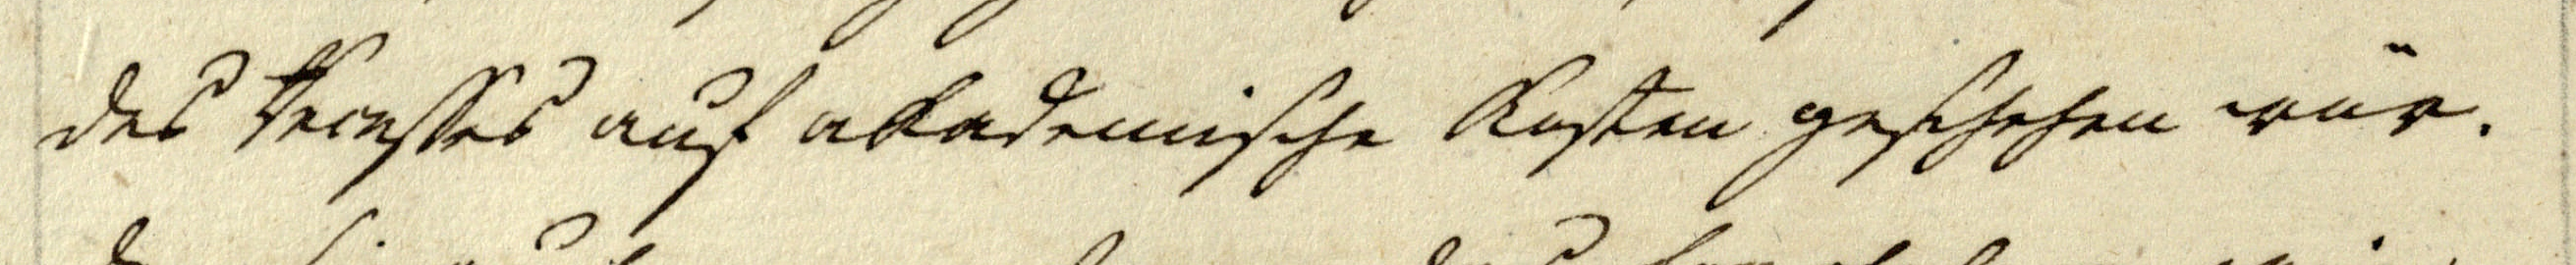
des Recesses auf akademische Kosten geschehen wür¬
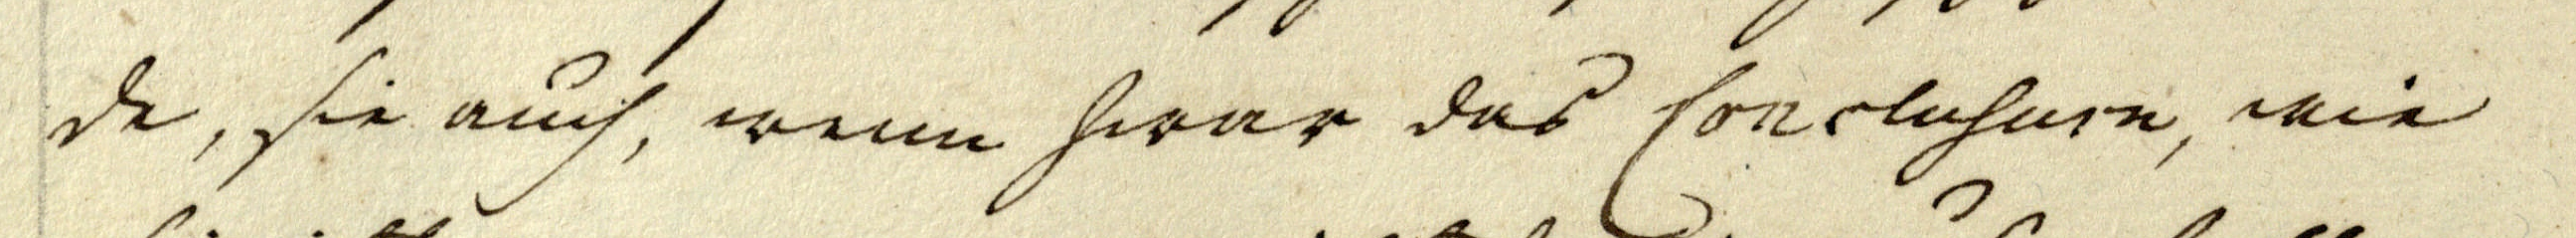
de, sie auch, wenn zwar das Conclusum, wie
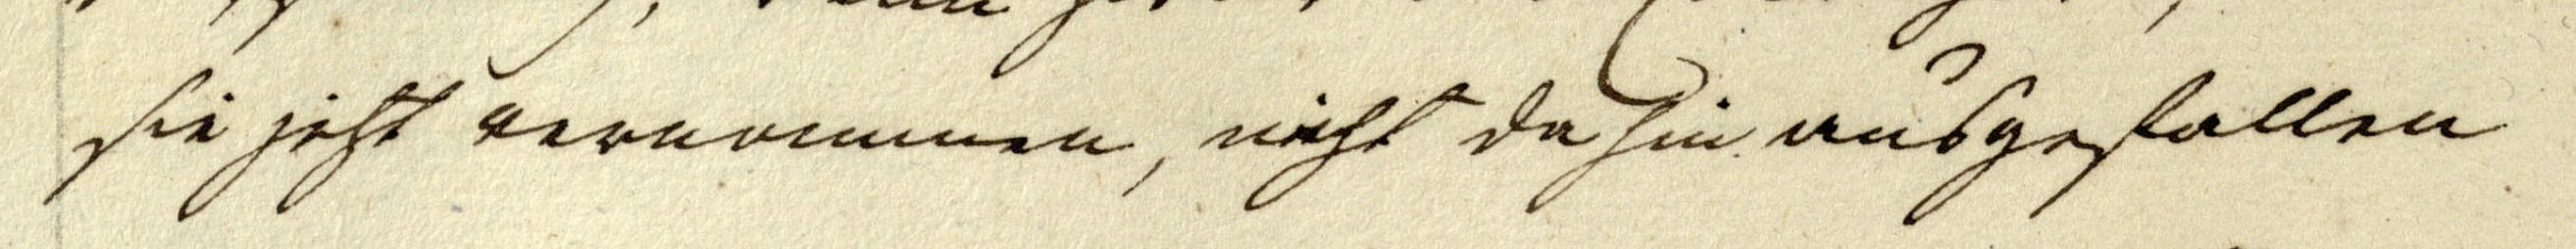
sie jetzt vernommen, nicht dahin ausgefallen
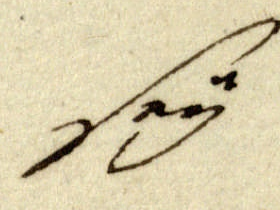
seÿ
